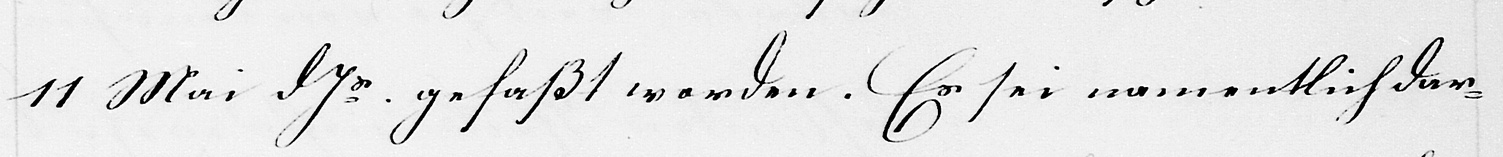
11 Mai dJs. gefaßt worden. Es sei namentlich dar¬
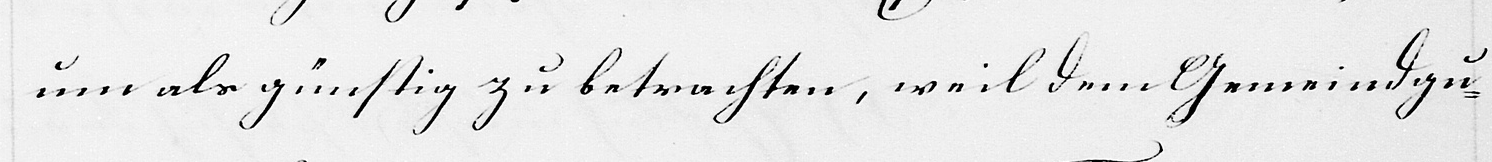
um als günstig zu betrachten, weil dem Gemeindgu¬
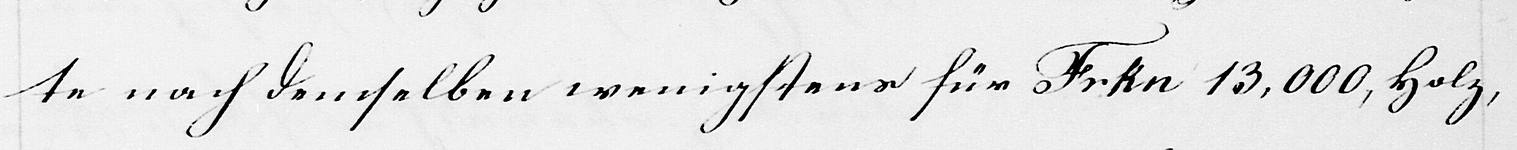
te nach demselben wenigstens für Frkn 13,000, Holz,
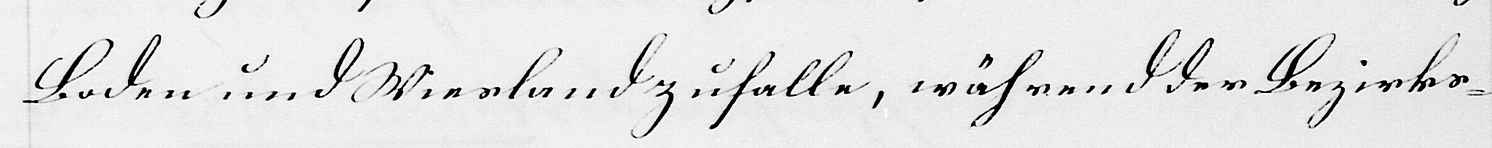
Boden und Wiesland zufalle, während der Bezirks¬
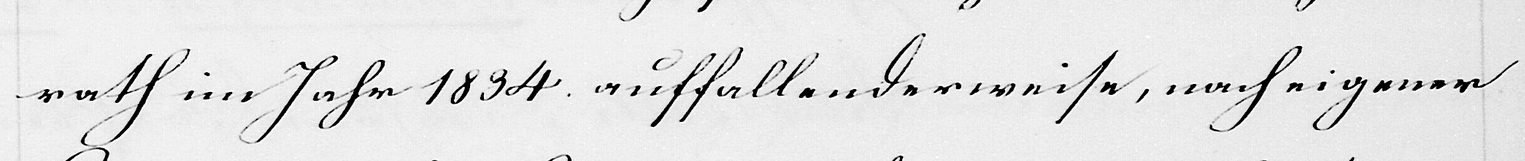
rath im Jahr 1834. auffallenderweise, nach eigener
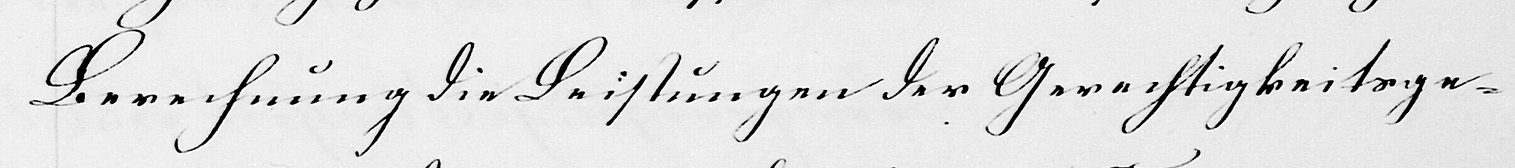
Berechnung die Leistungen der Gerechtigkeitsge¬
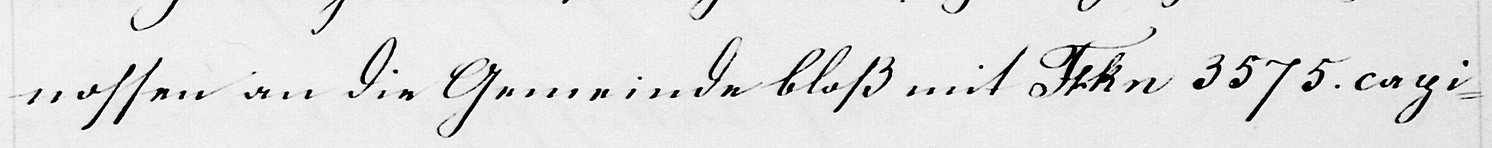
nossen an die Gemeinde bloß mit Frkn 3575. capi¬
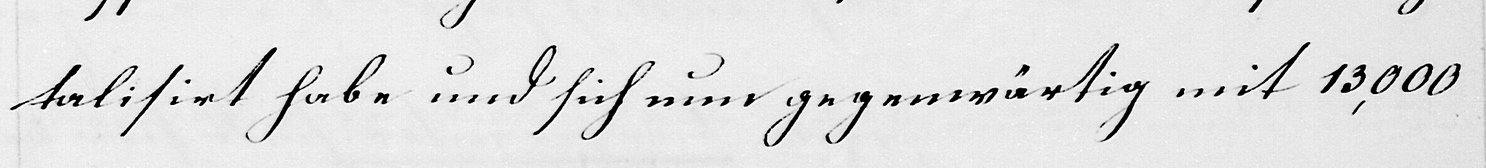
talisirt habe und sich nun gegenwärtig mit 13,000
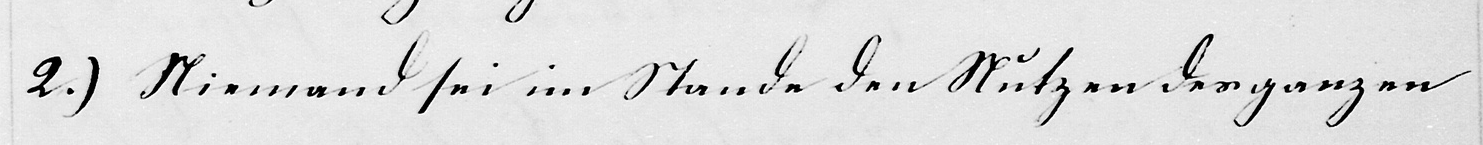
2.) Niemand sei im Stande den Nutzen des ganzen
